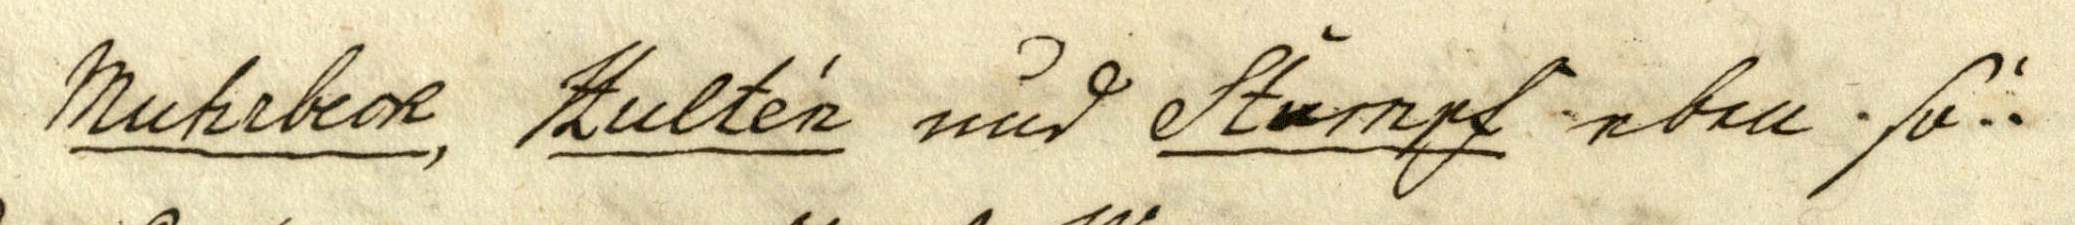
Muhrbeck, Hultén und Stumpf eben so:
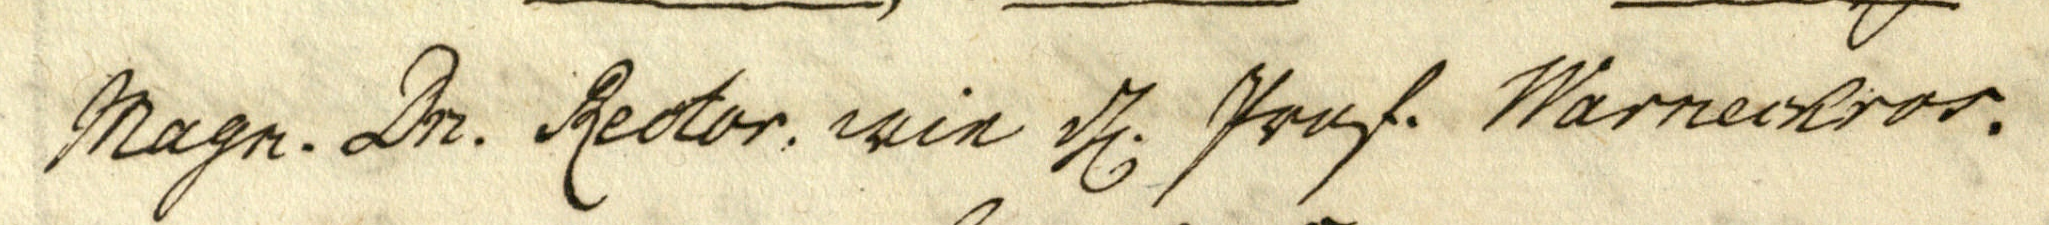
Magn. Dn. Recotr, wie dh. Prof. Warneckros.
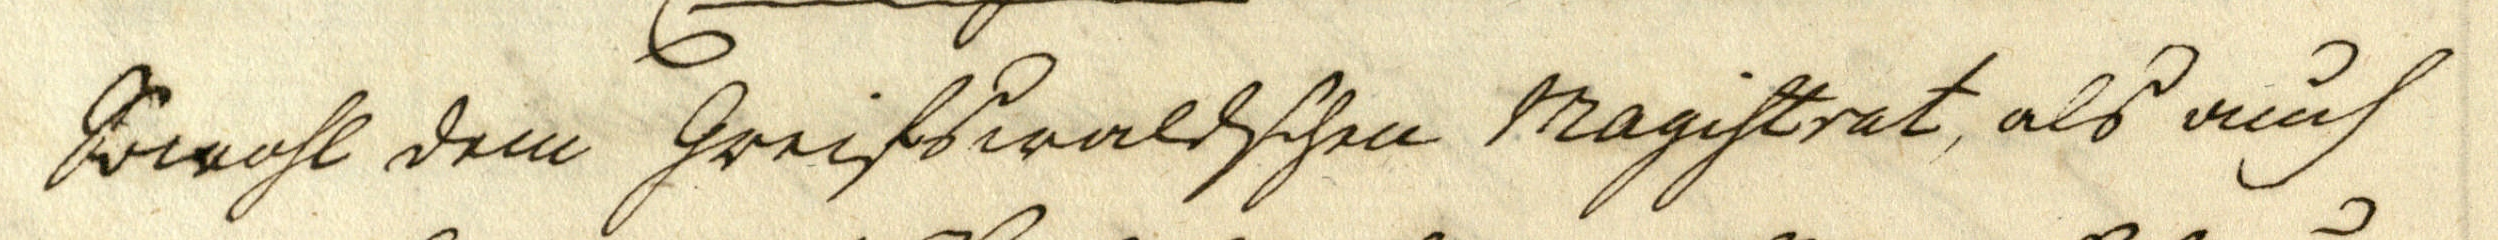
Sowohl dem Greifswaldschen Magistrat, als auch
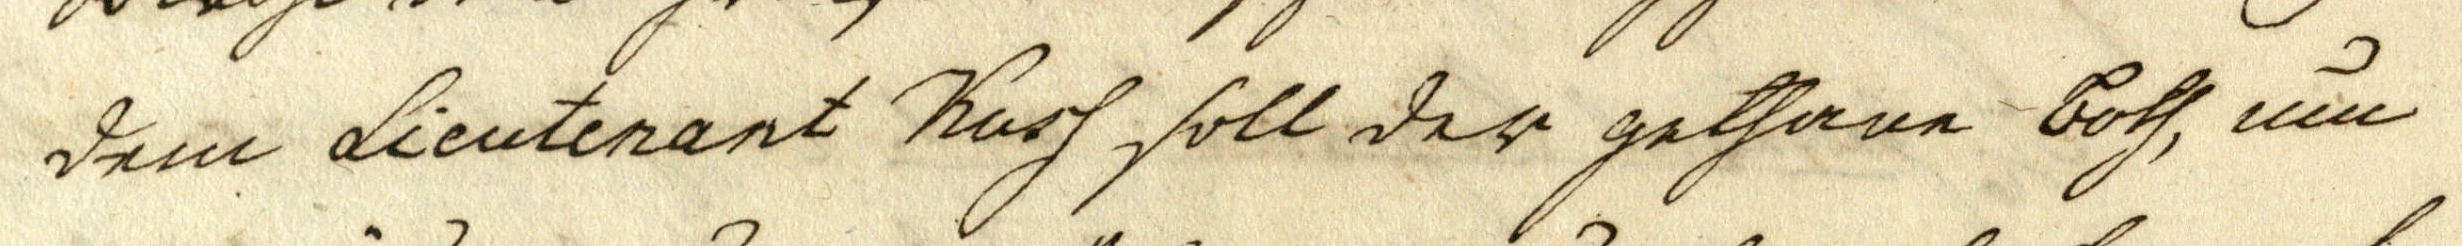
dem Lieutenant Kuss soll der gethane Both, um
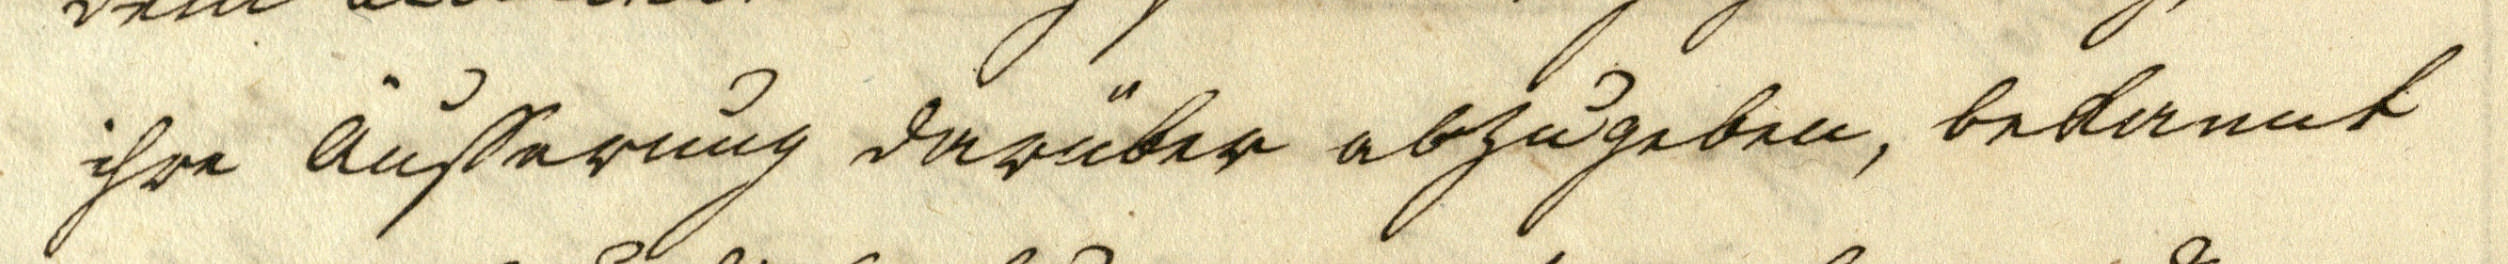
ihre Äusserung darüber abzugeben, bekannt
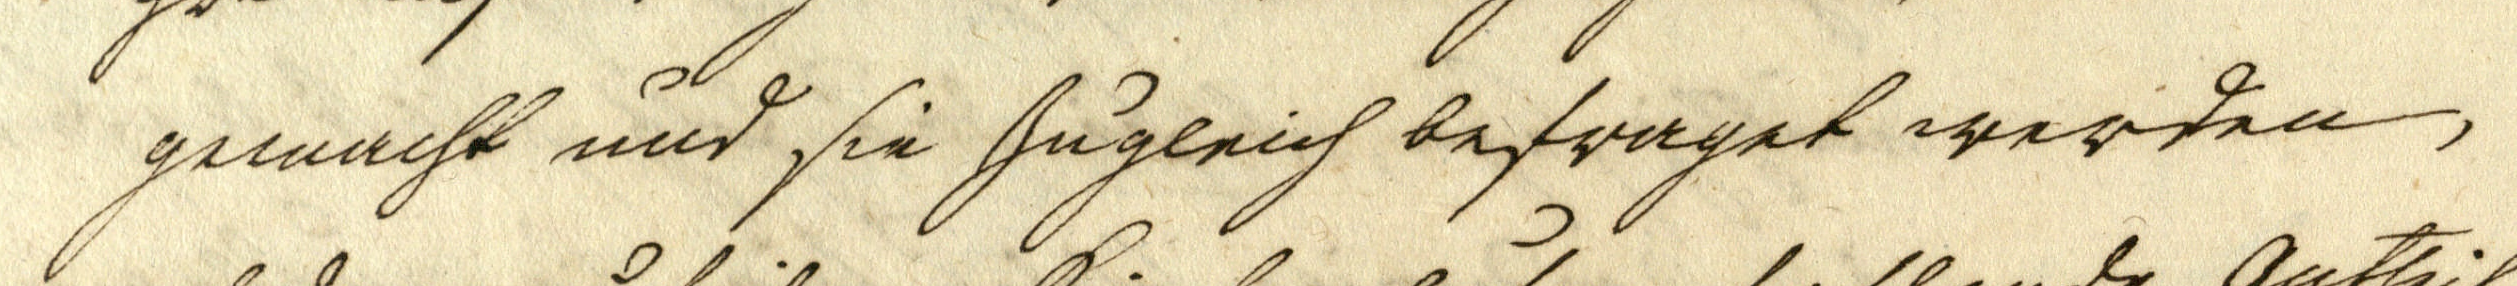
gemacht und sie zugleich befraget werden,
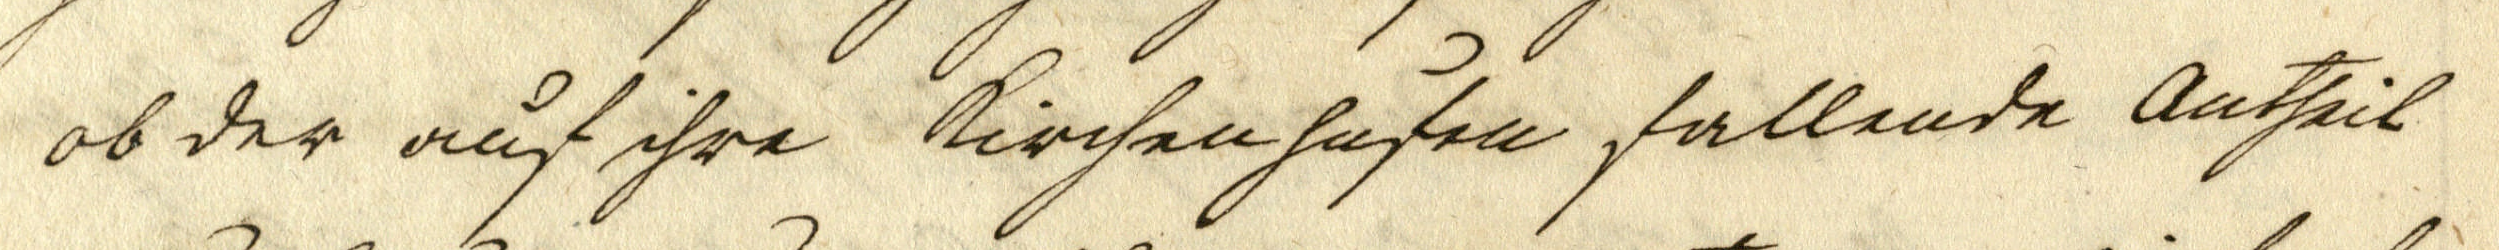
ob der auf ihre Kirchenhufen fallende Antheil
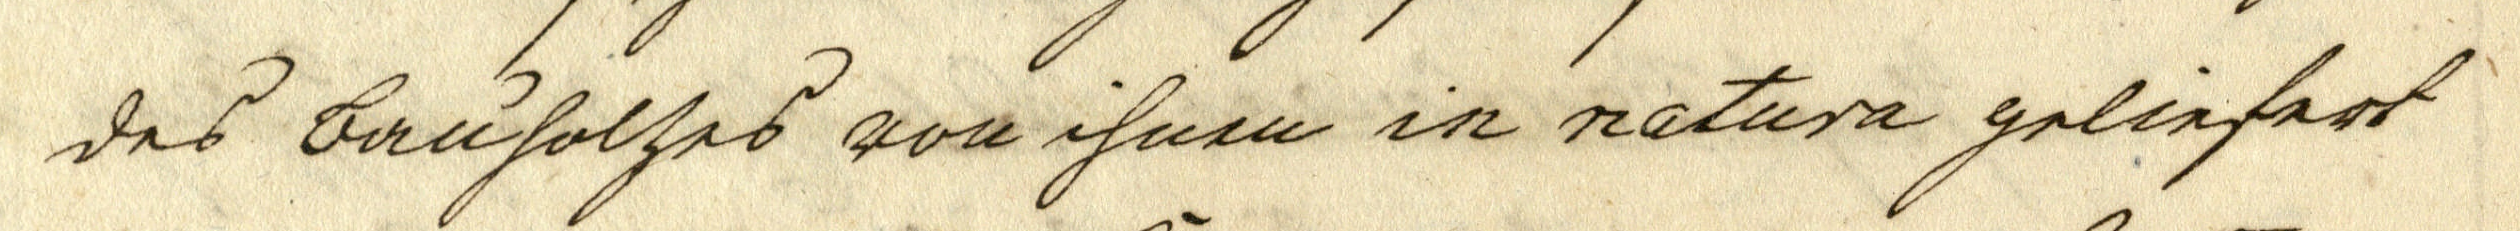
des Bauholtzes von ihnen in natura geliefert
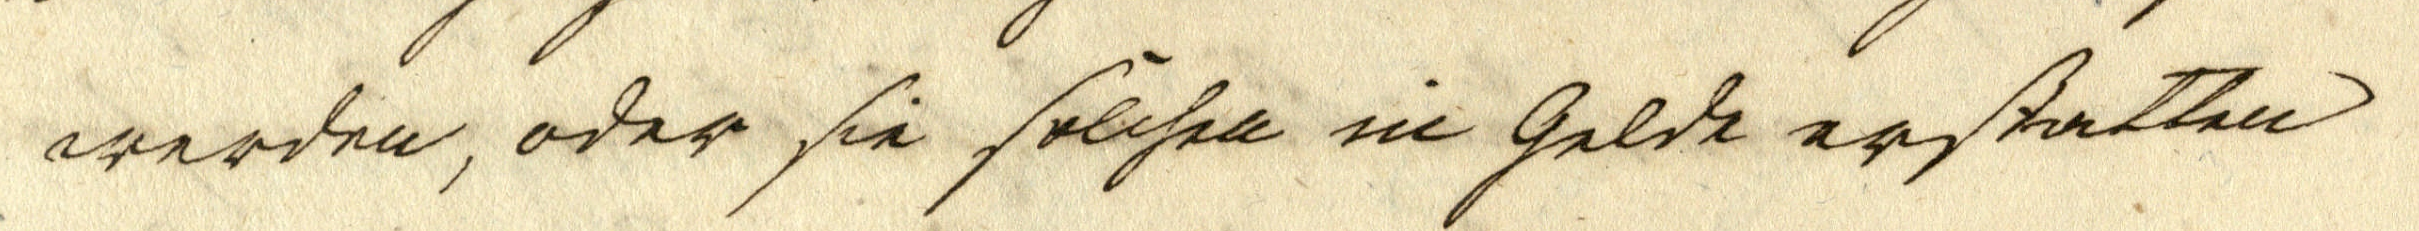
werde, oder sie solchen in Gelde erstatten
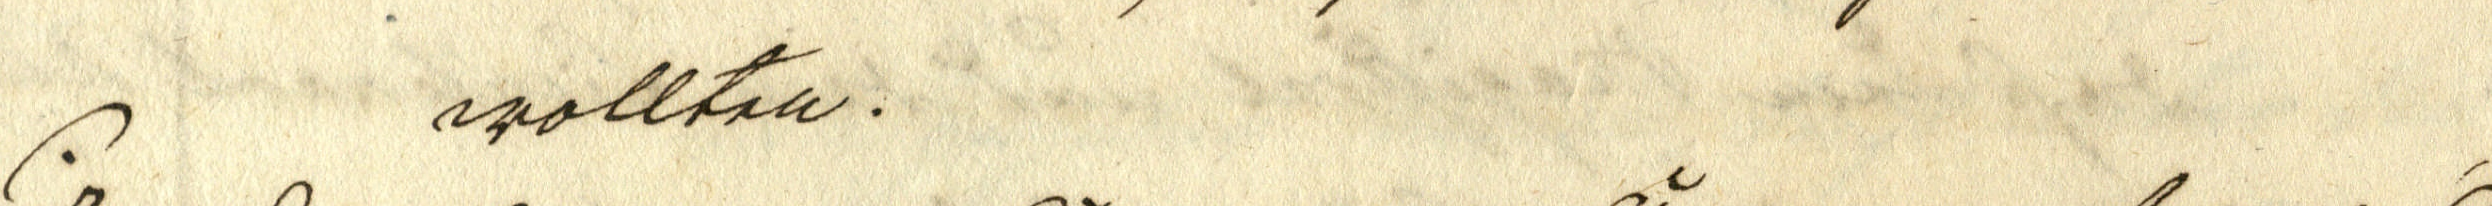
wollten.
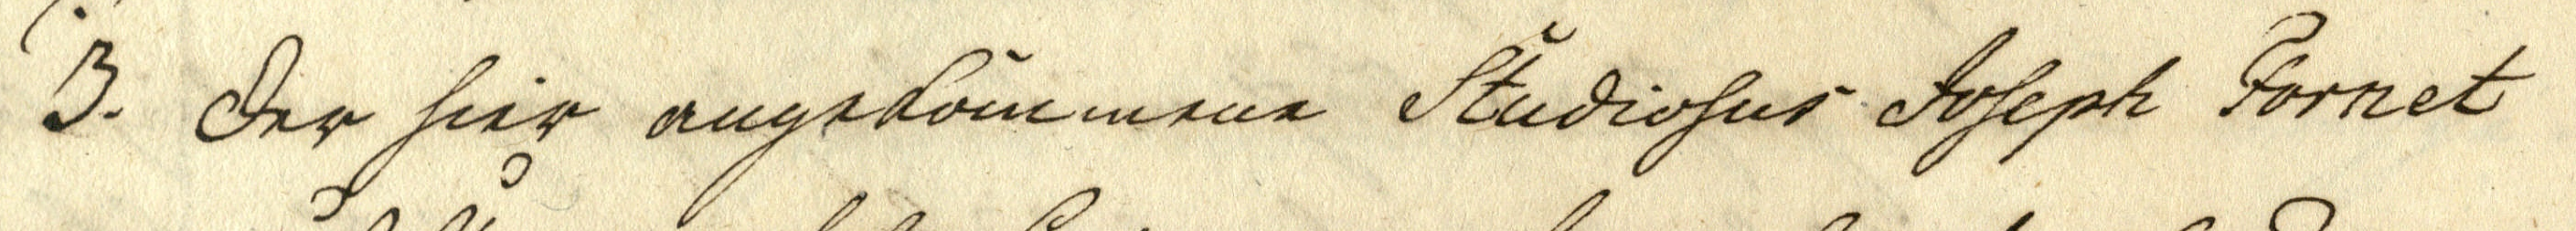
3. Der hier angekommene Studiosus Joseph Fornet
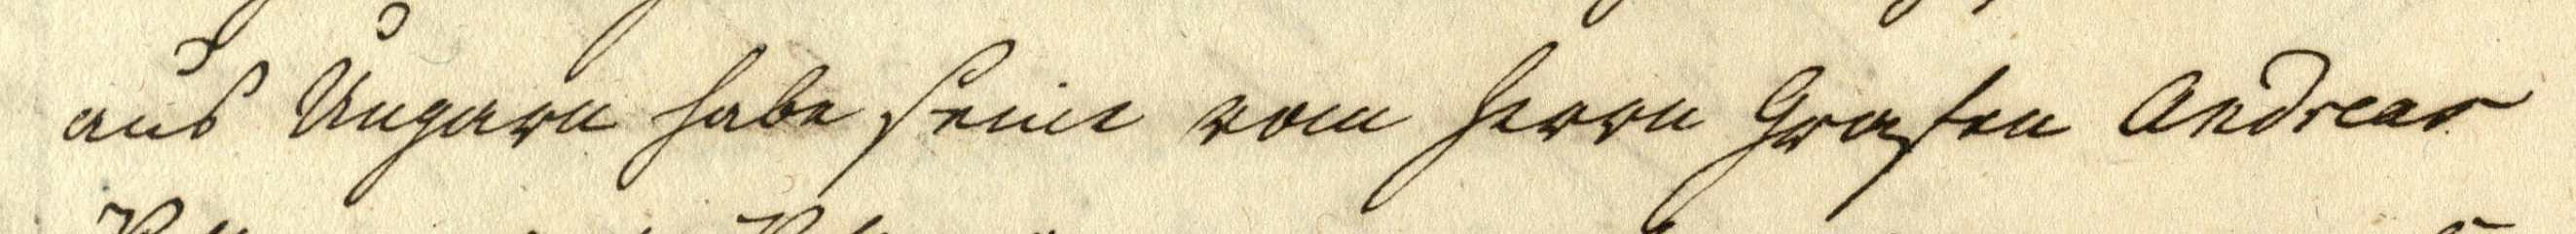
aus Ungarn habe seine vom Herrn Grafen Andreas
